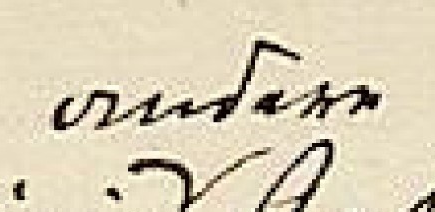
andern
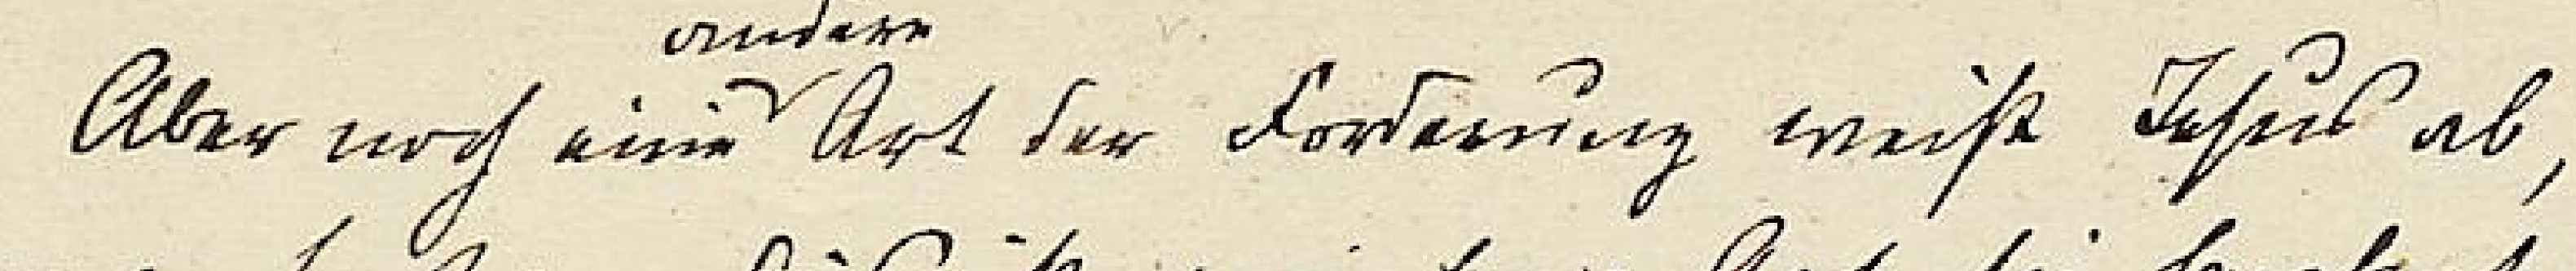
Aber noch eine Art der Forderung weist Jesus ab,
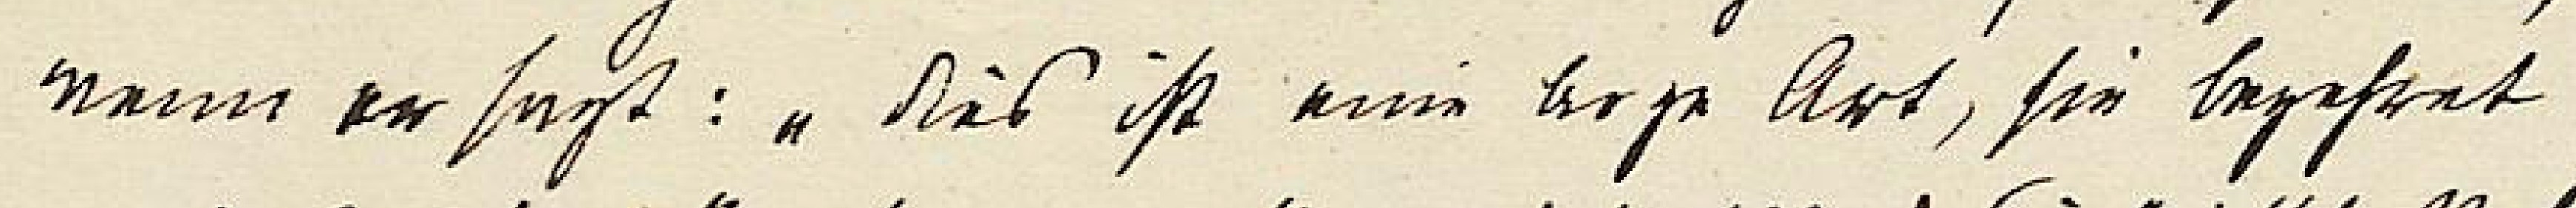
wenn er sagt: "dies ist eine arge Art, sie begehret
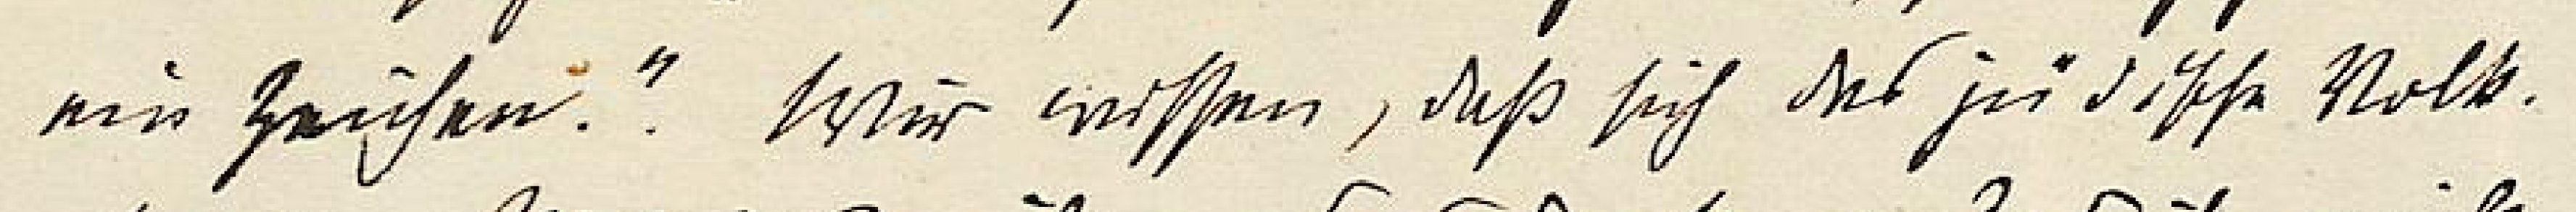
ein Zeichen." Wir wissen, daß sich das jüdische Volk
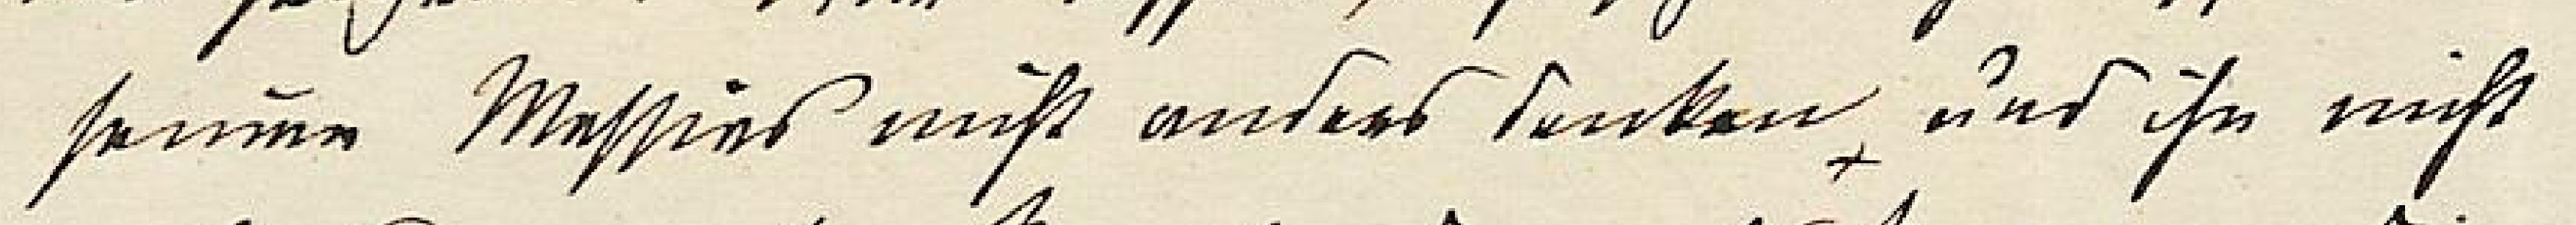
seinen Messias nicht anders denken und ihn nicht
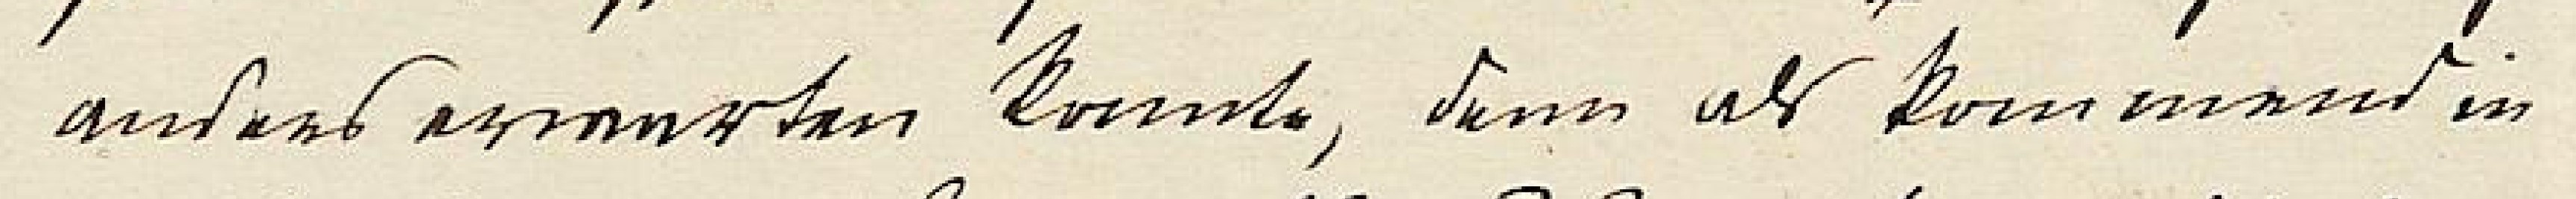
anders erwarten konnte, denn als kommend in
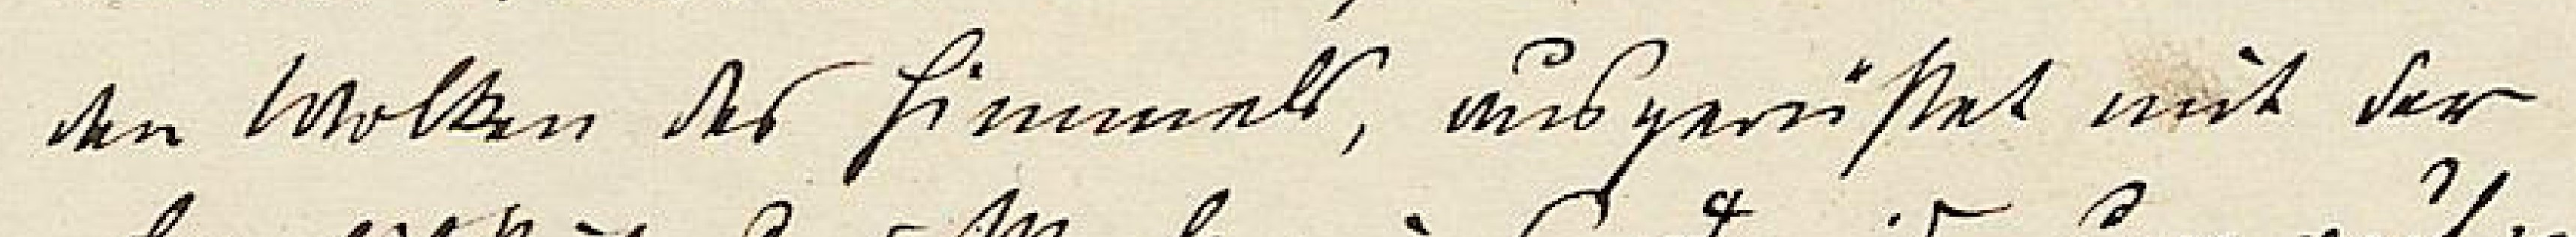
den Wolken des Himmels, ausgerüstet mit der
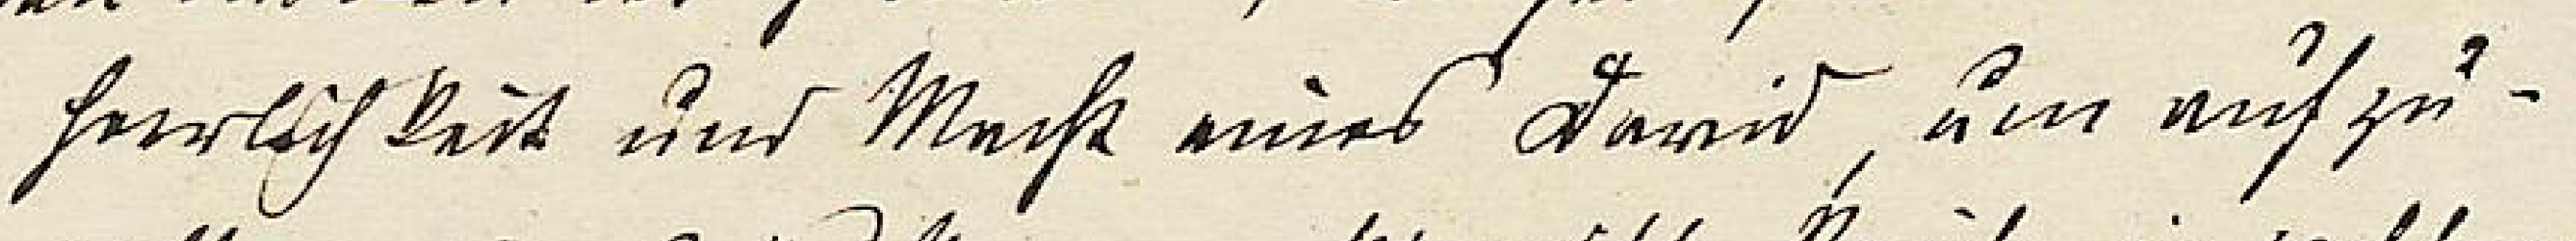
Herlichkeit und Macht eines David um aufzu¬
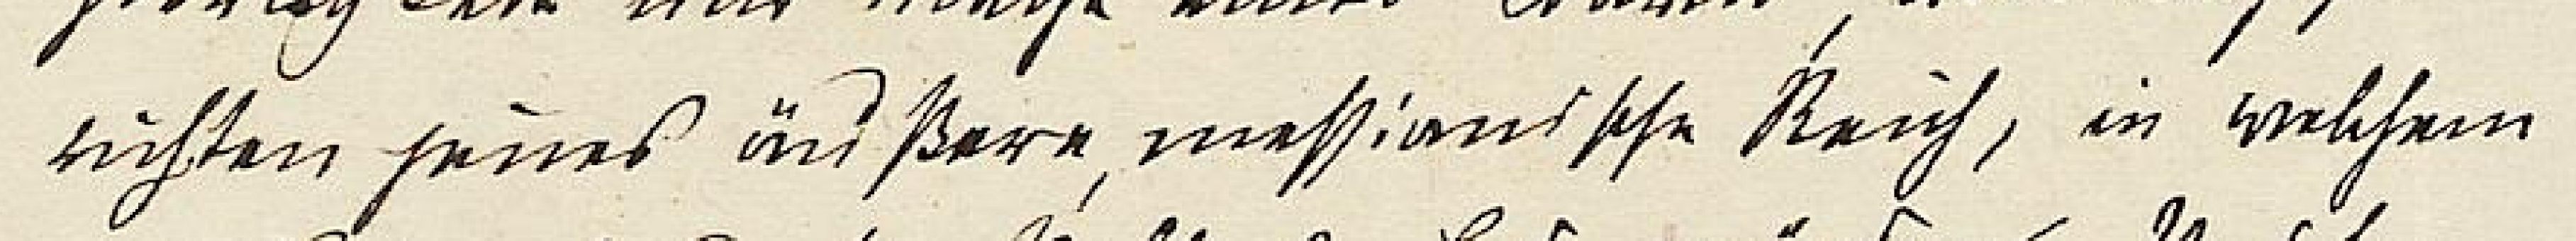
richten jenes äußere messianische Reich, in welchem
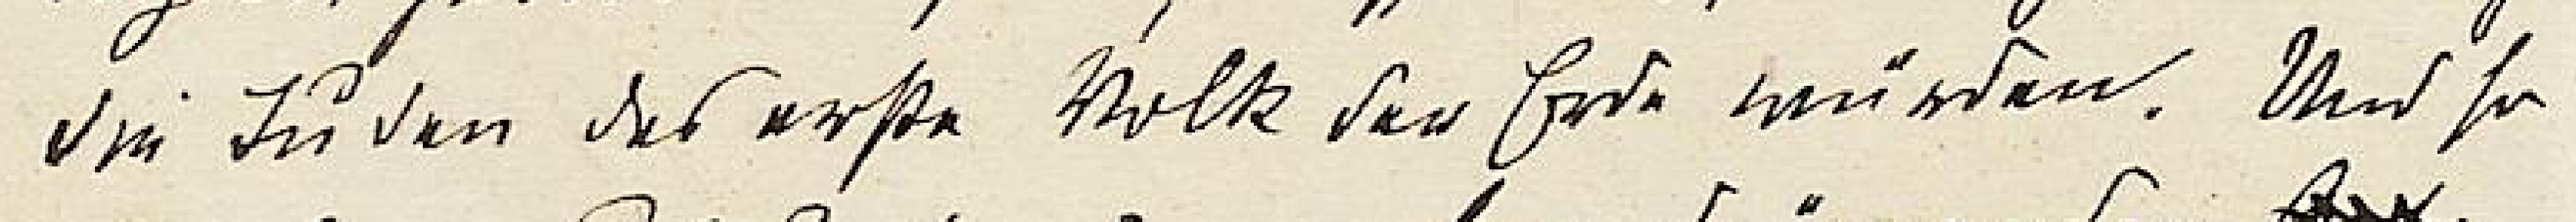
die Juden das erste Volk der Erde würden. Und so
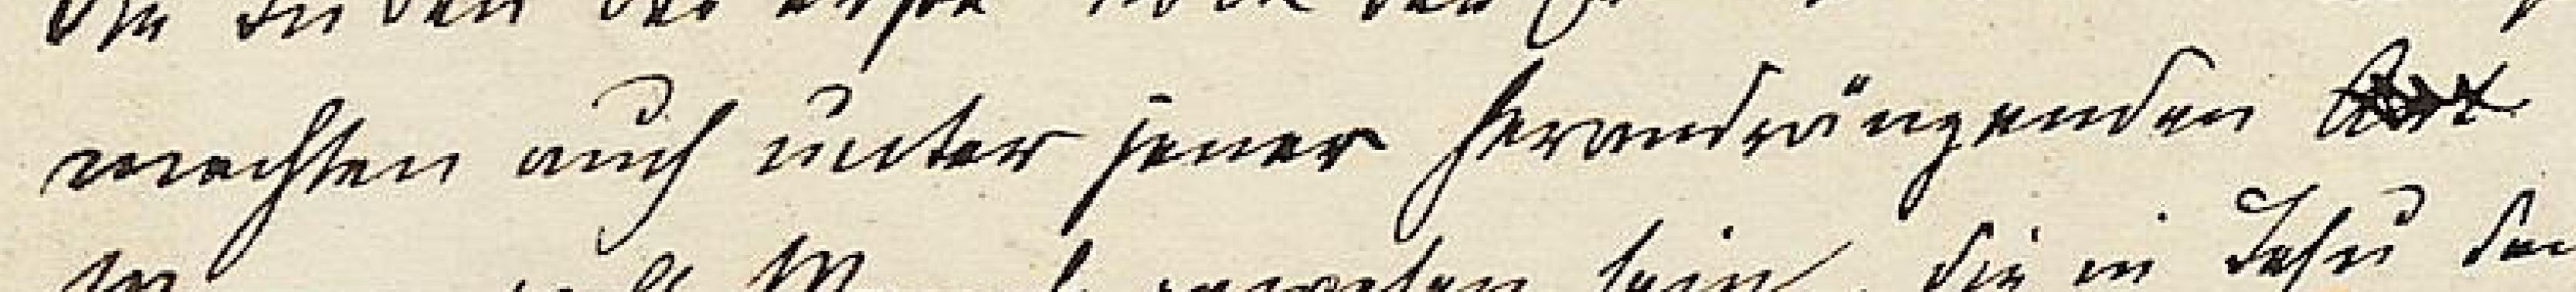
machten auch unter jener herandrängenden Art
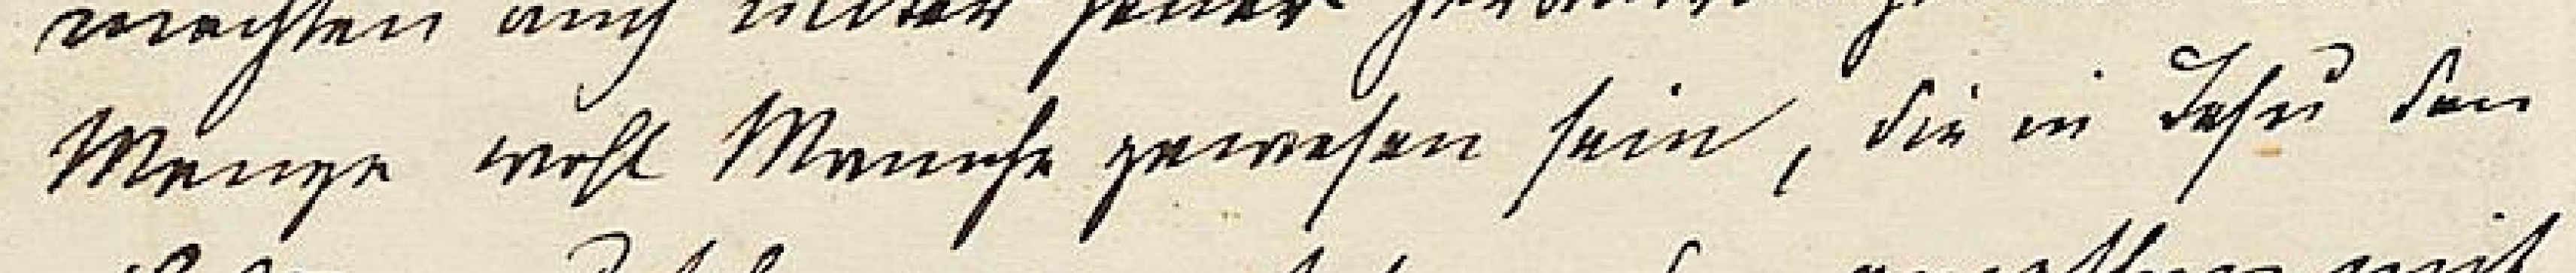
Menge wohl Manche gewesen sein, die in Jesu den
